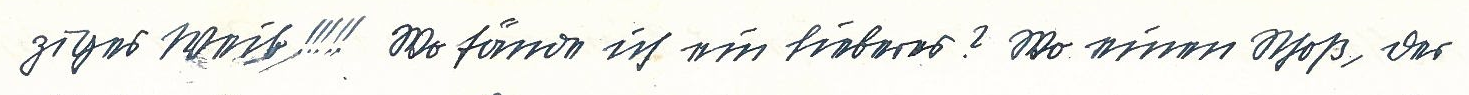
ziges Weib!!!!! Wo fände ich ein lieberes? Wo einen Schoß, der
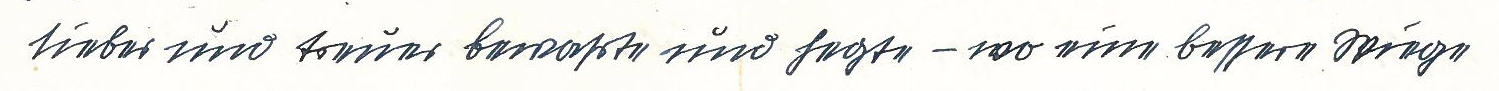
lieber und treuer bewahrte und hegte – wo eine bessere Wiege
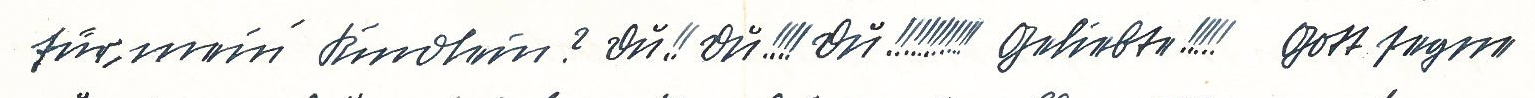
für „mein“ Kindlein? Du!! Du!!!! Du!!!!!!!!!!! Geliebte!!!!! Gott segne
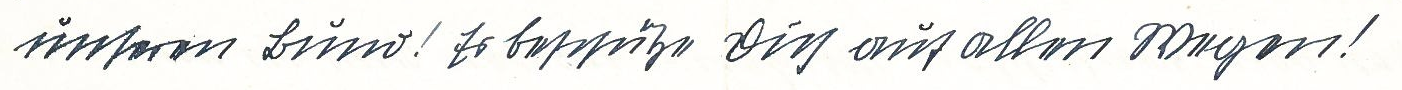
unseren Bund! Er beschütze Dich auf allen Wegen!
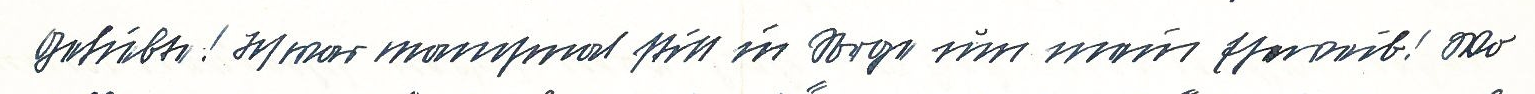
Geliebte! Ich war manchmal still in Sorge um mein Eheweib! Wo
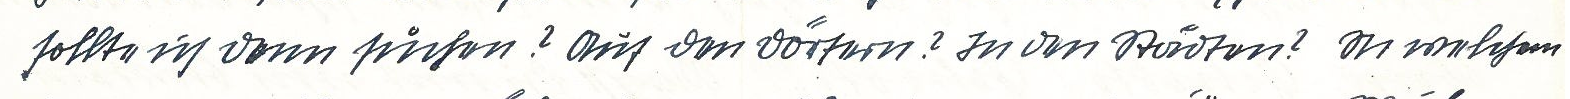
sollte ich denn suchen? Auf den Dörfern? In den Städten? In welchem
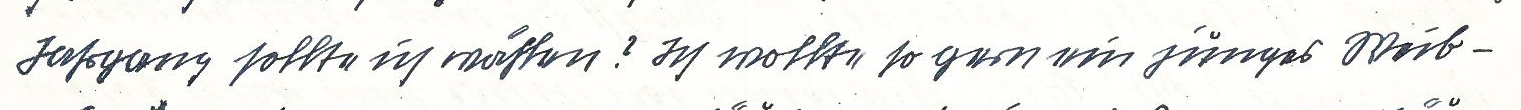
Jahrgang sollte ich wählen? Ich wollte so gern ein junges Weib –
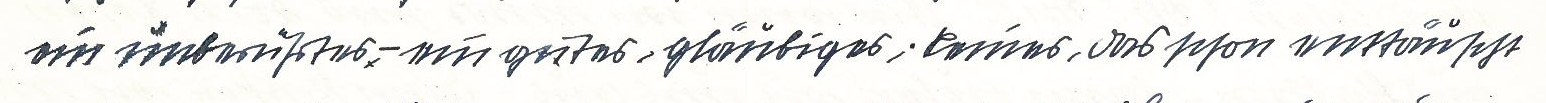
ein unberührtes, – ein gutes, gläubiges, – keines, das schon enttäuscht
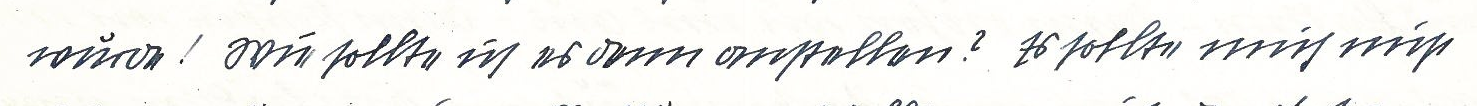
wurde! Wie sollte ich es denn anstellen? Es sollte mich nicht
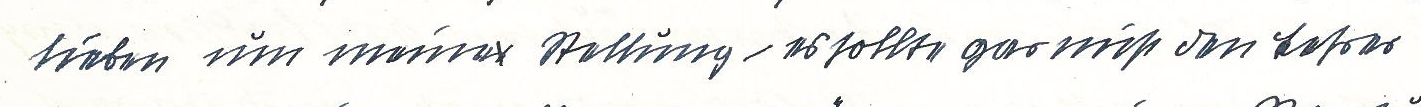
lieben um meiner Stellung, es sollte gar nicht den Lehrer
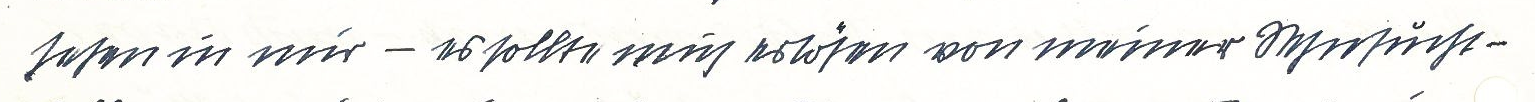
sehen in mir – es sollte mich erlösen von meiner Sehnsucht –
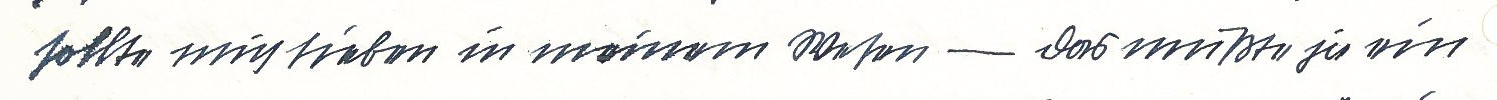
sollte mich lieben in meinem Wesen – – das mußte ja ein
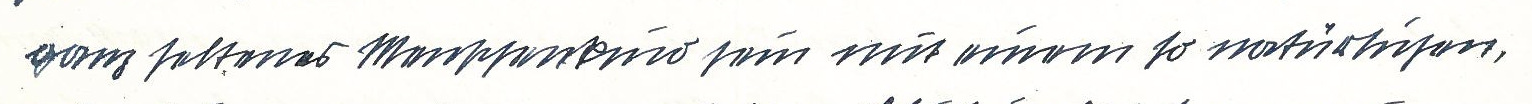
ganz seltenes Menschenkind sein mit einem so natürlichen,
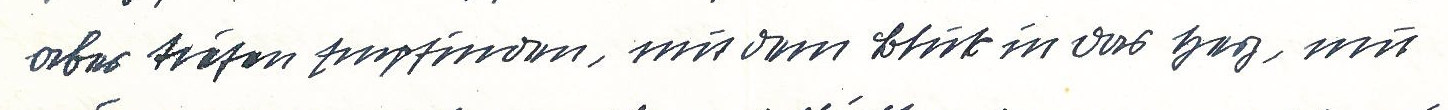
aber tiefen Empfinden, mit dem Blick in das Herz, mit
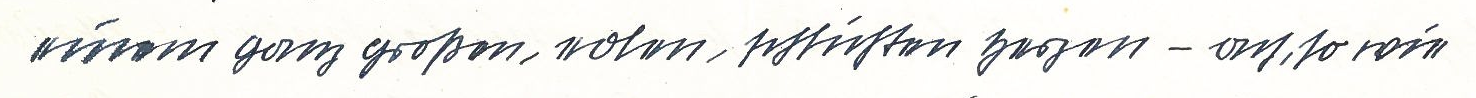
einem ganz großen, edlen, schlichten Herzen – ach, so wie
